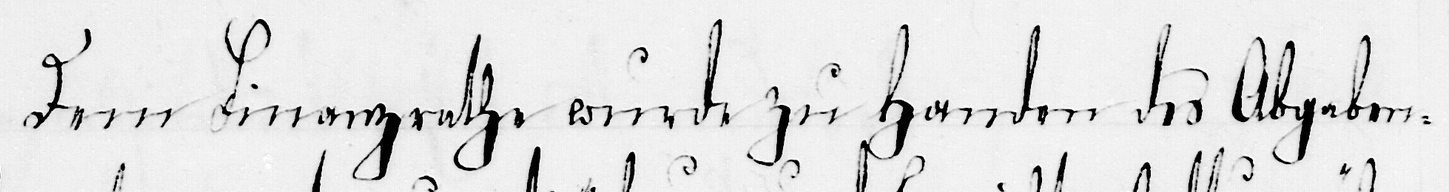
Dem Finanzrathe wurde zu Handen des Abgaben¬
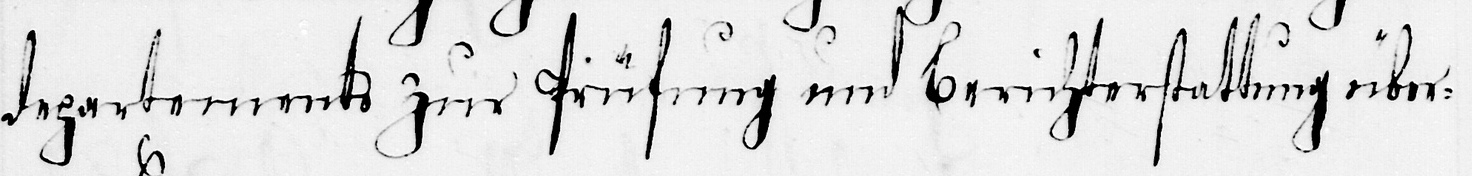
departements zur Prüfung und Berichterstattung über¬
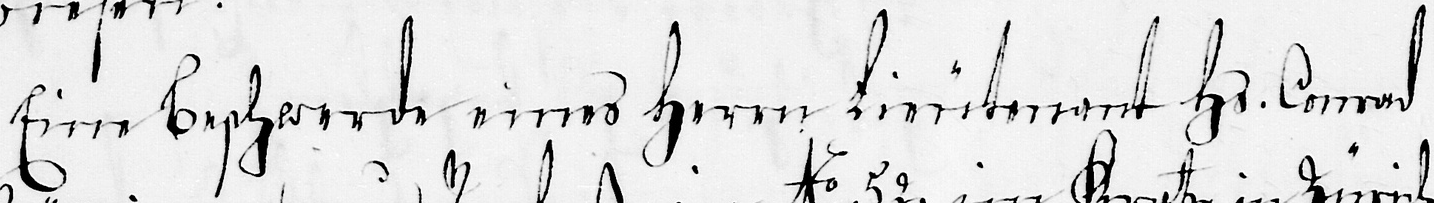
Eine Beschwerde eines Herrn Lieutenant Hs. Conrad
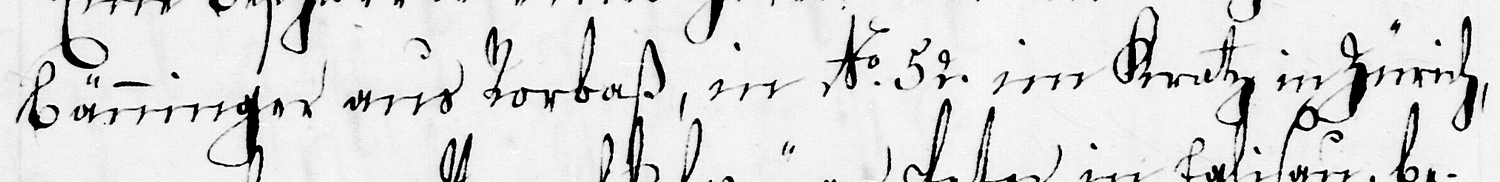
Bänninger aus Rorbaß, in No. 52. im Kratz in Zürich,
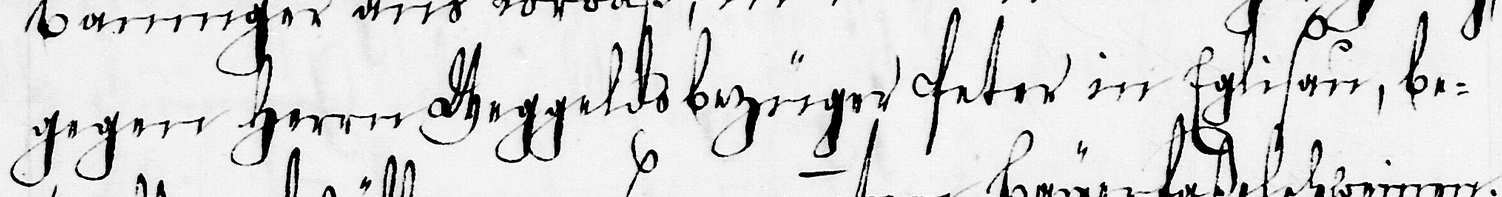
gegen Herrn Weggeldsbezüger Peter in Eglisau, be¬
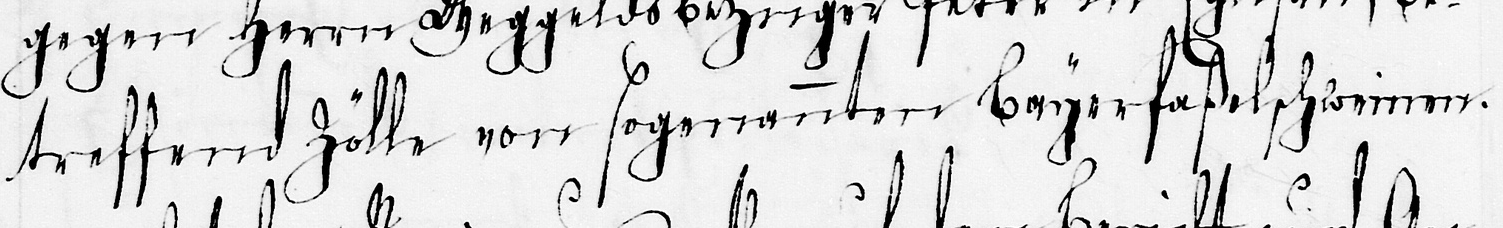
treffend Zölle von sogenannten Bayerfaßelschweinen.
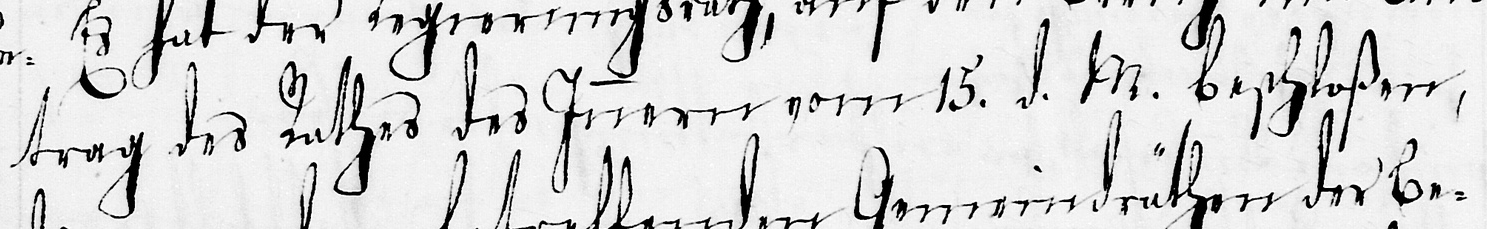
trag des Rathes des Innern vom 15. d. M. beschloßen,
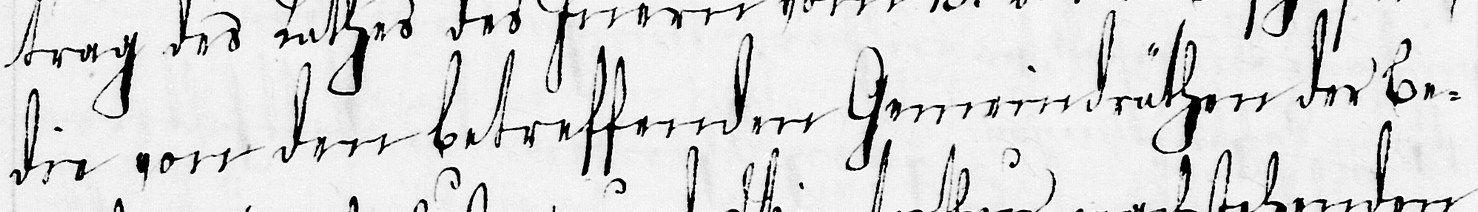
die von den betreffenden Gemeindräthen der Be¬
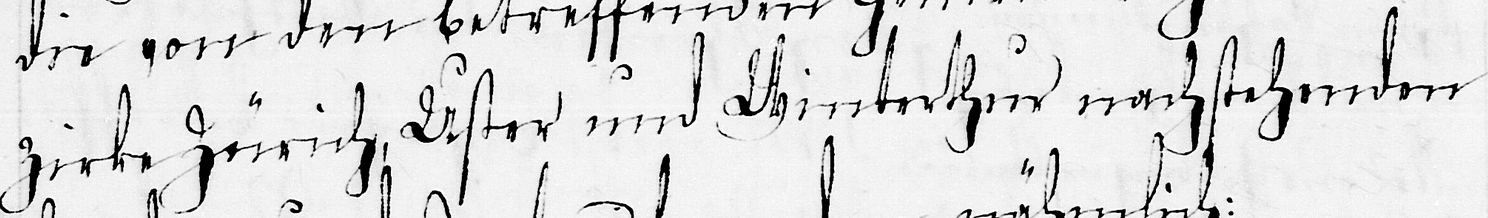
zirke Zürich, Uster und Winterthur nachstehenden
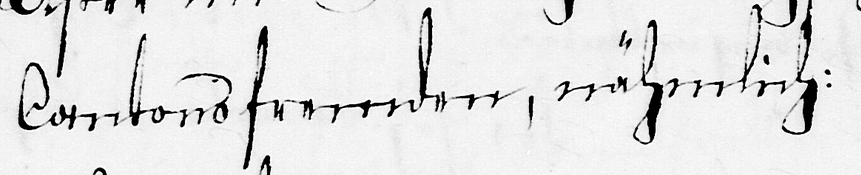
Cantonsfremden, nähmlich:
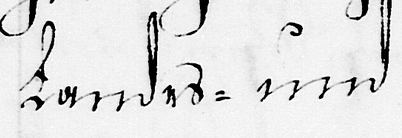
Landes- und
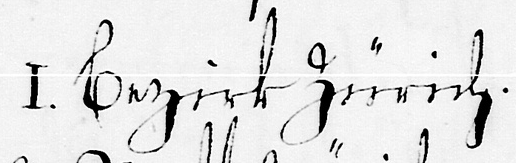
I. Bezirk Zürich.
